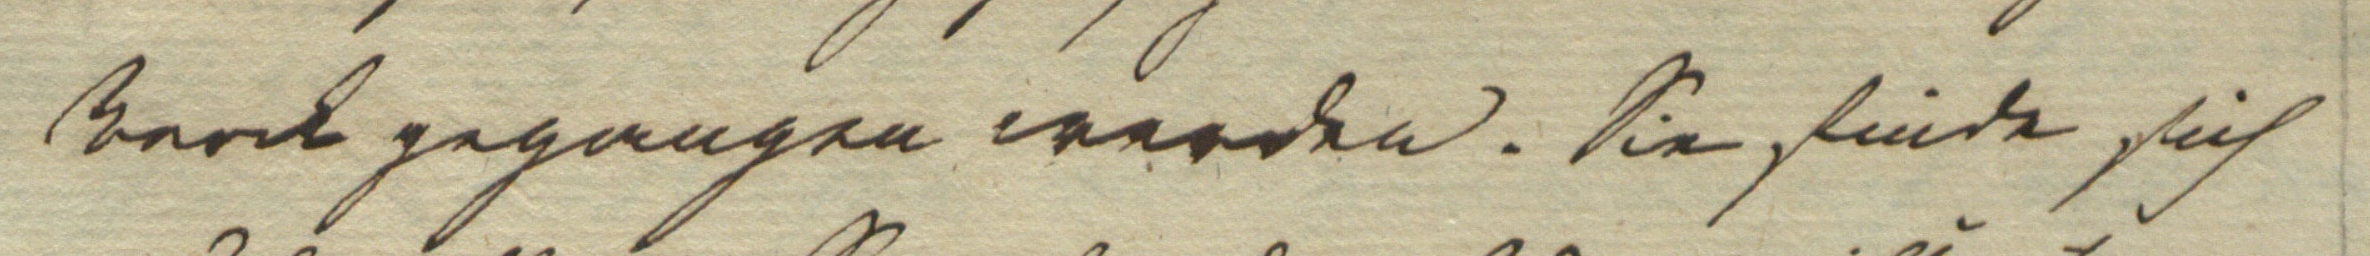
Werk gegangen werden. Sie finde sich
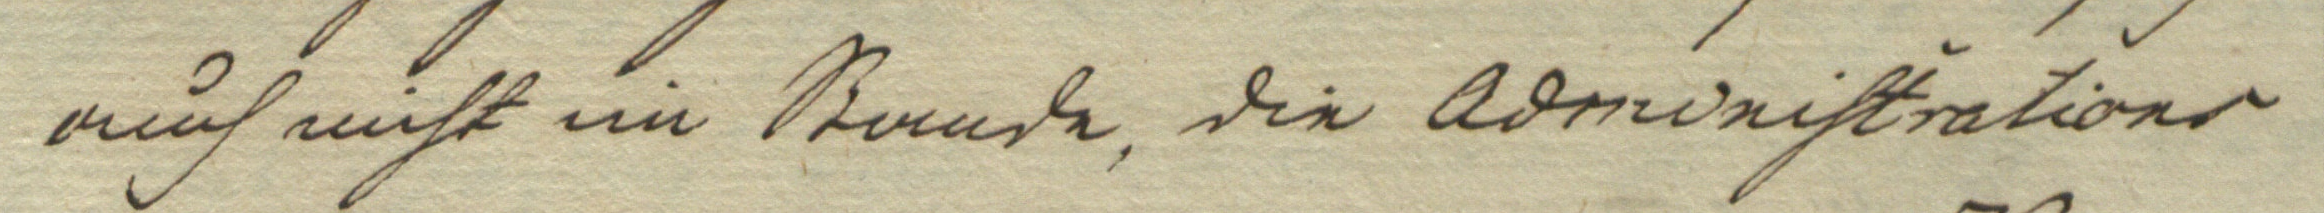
auch nicht im Stande, die Adminstrations
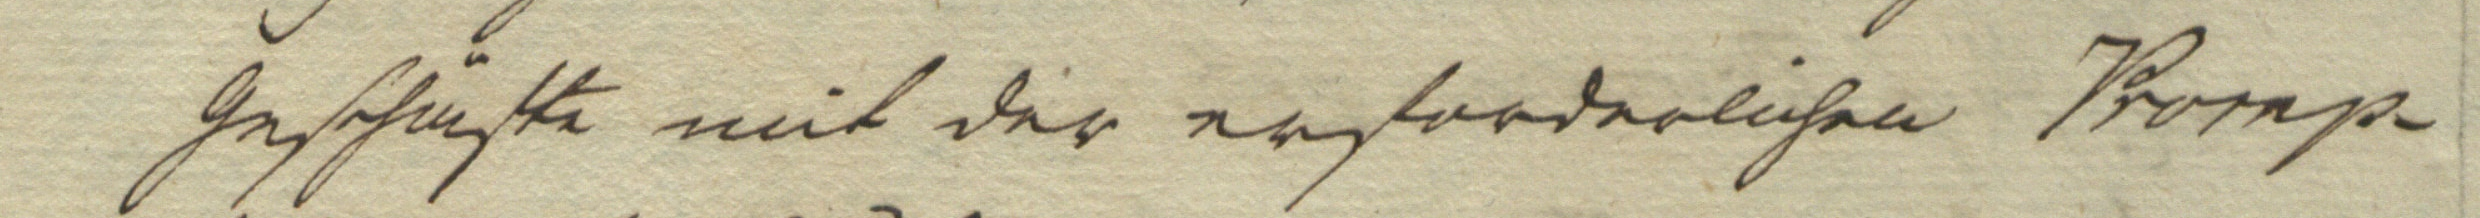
Geschäfte mit der erforderlichen Promp¬
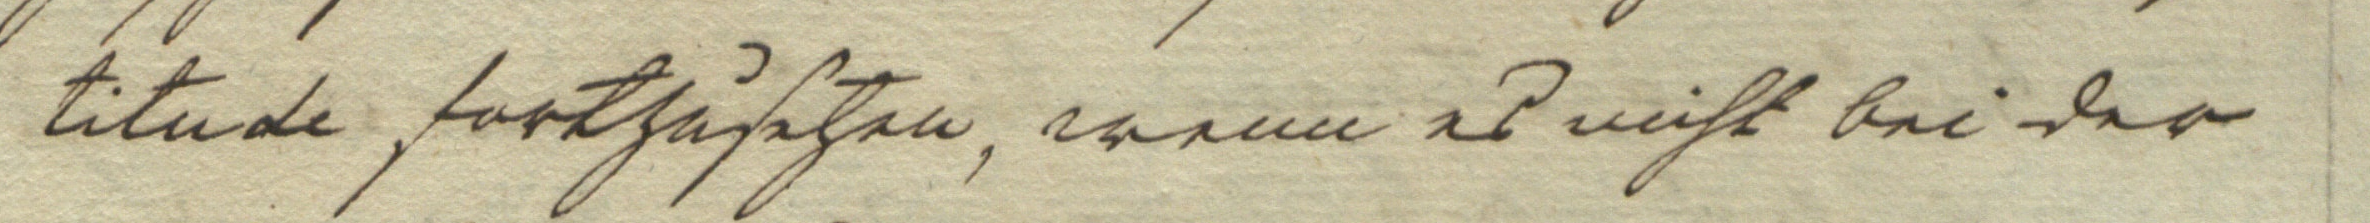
titude fortzusetzen, wenn es nicht bei der
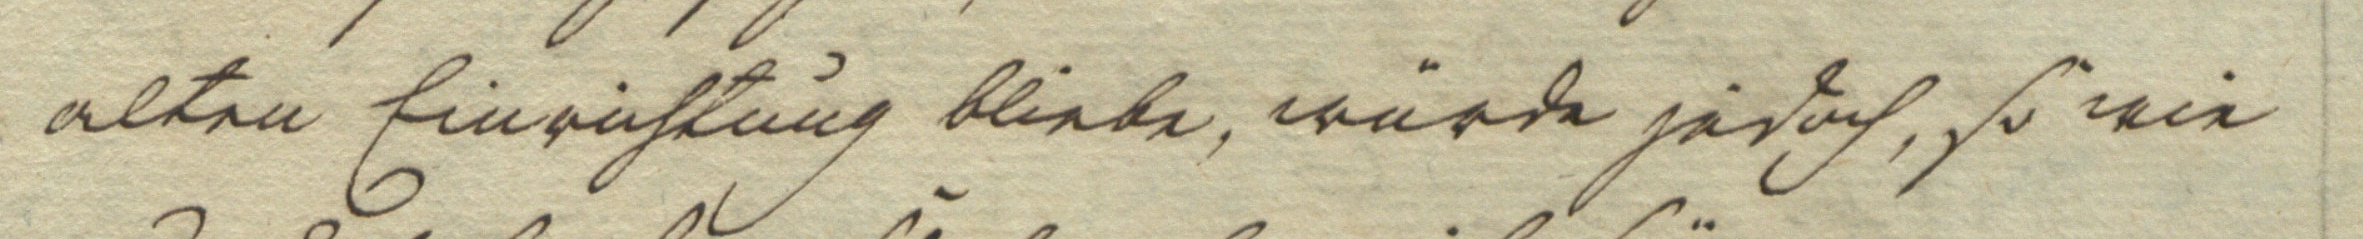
alten Einrichtung bliebe, würde jedoch, so wie
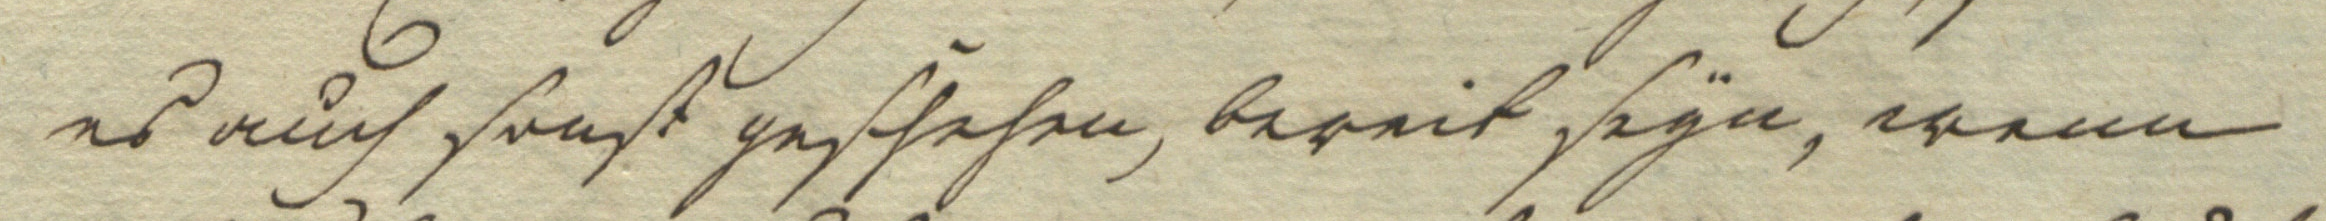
es auch sonst geschehen, bereit seyn, wenn
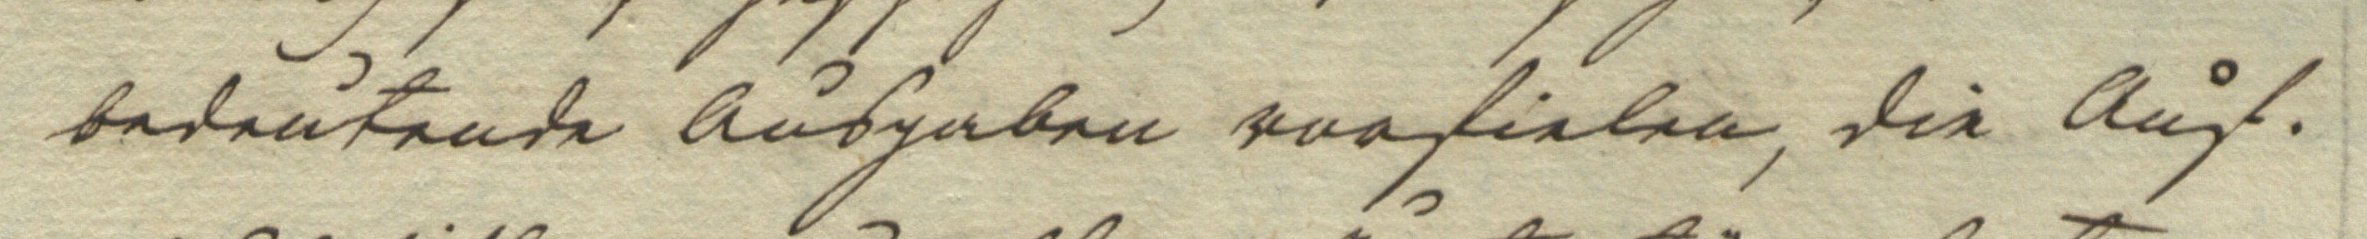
bedeutende Ausgaben vorfielen, die Auf¬
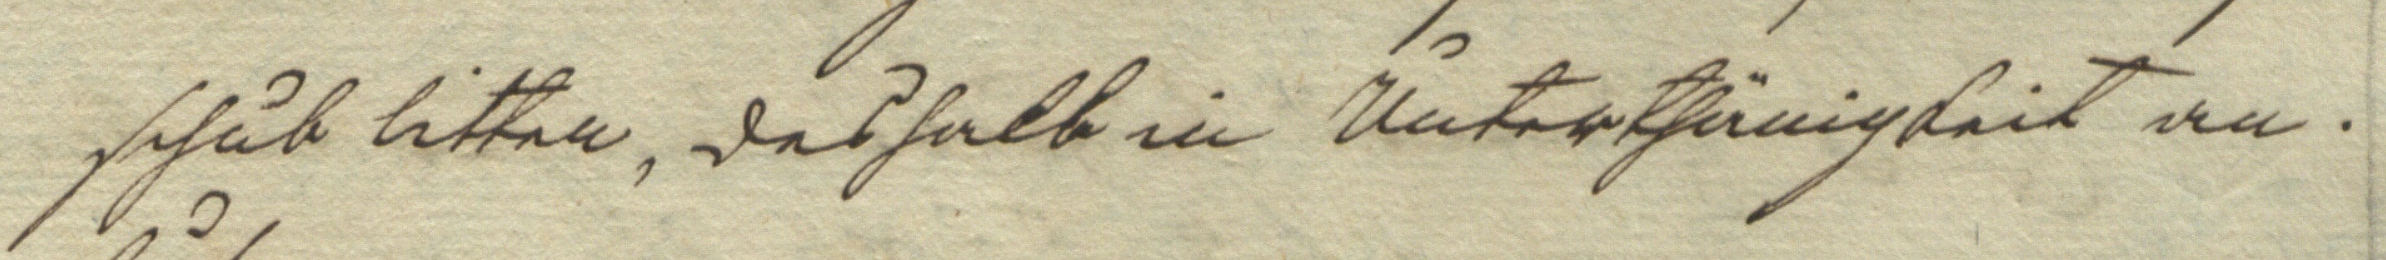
schub litten, deshalb in Unterthänigkeit an¬
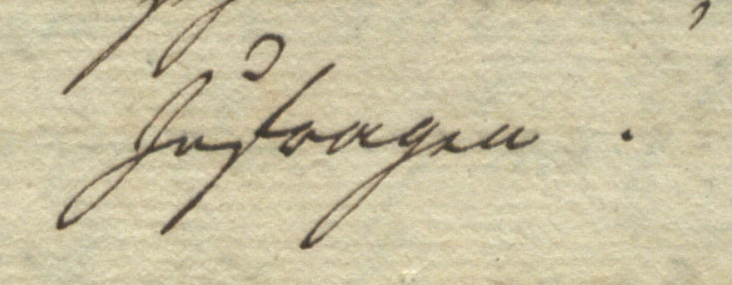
zufragen.
